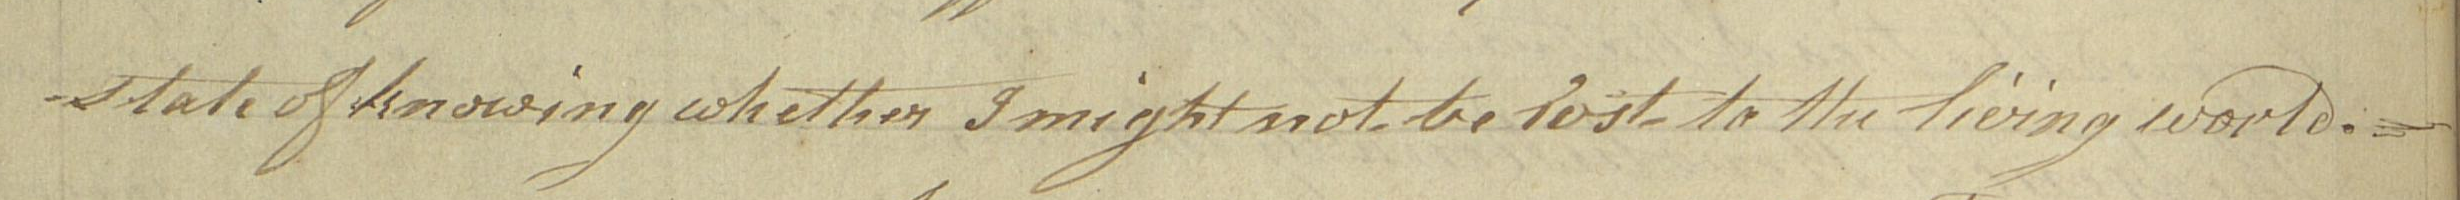state of knowing whether I might not be lost to the living world.
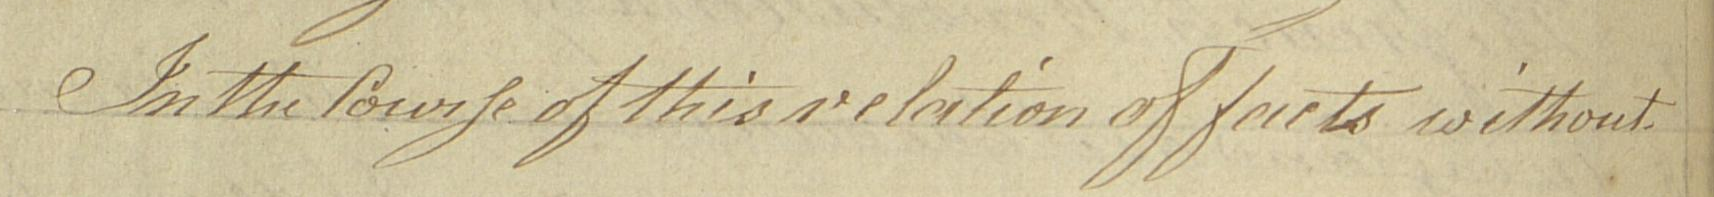In the Course of this relation of facts without
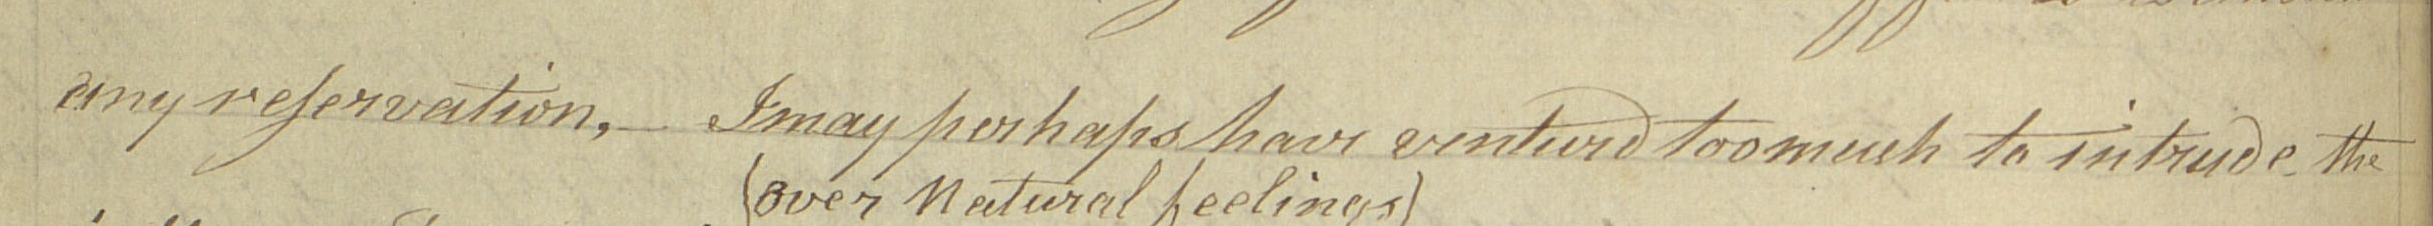my reservation, I may perhapes have ventured too much to intrude the
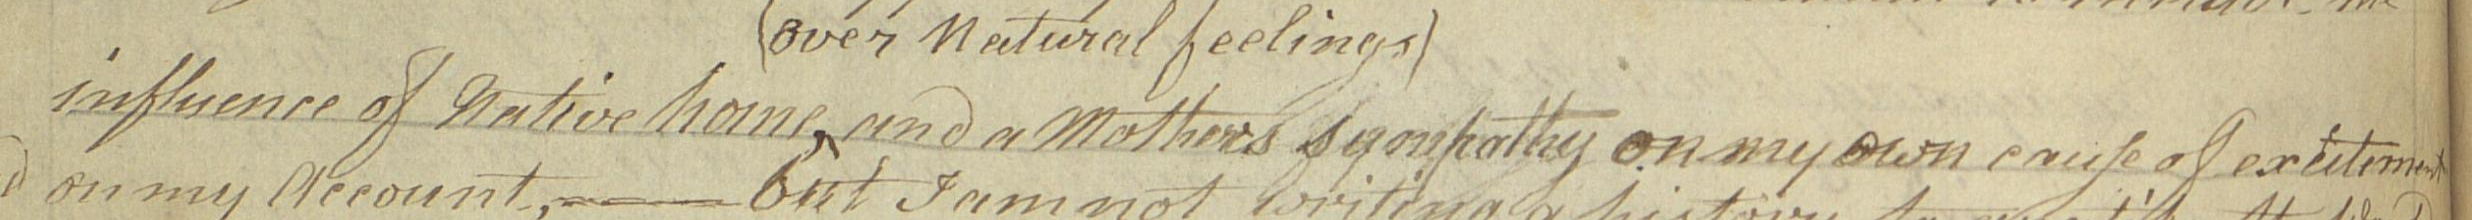influence of Native home ^ and a Mothers Sympathy on my own cause of excitement
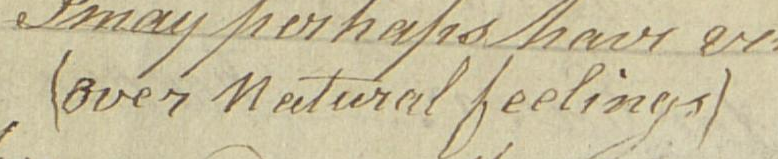(over Natural feelings)
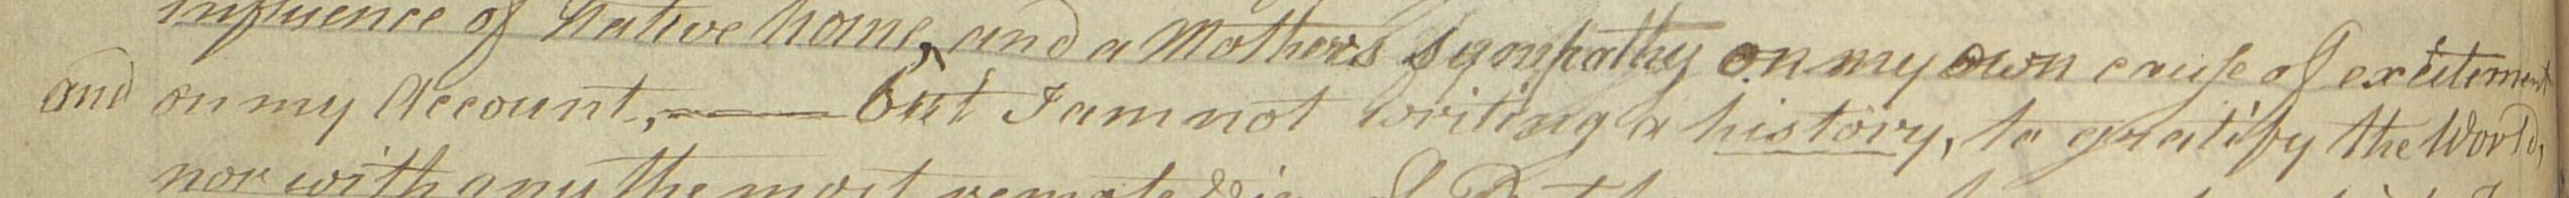and on my Account, but I am not writing a history, to gratify the World,
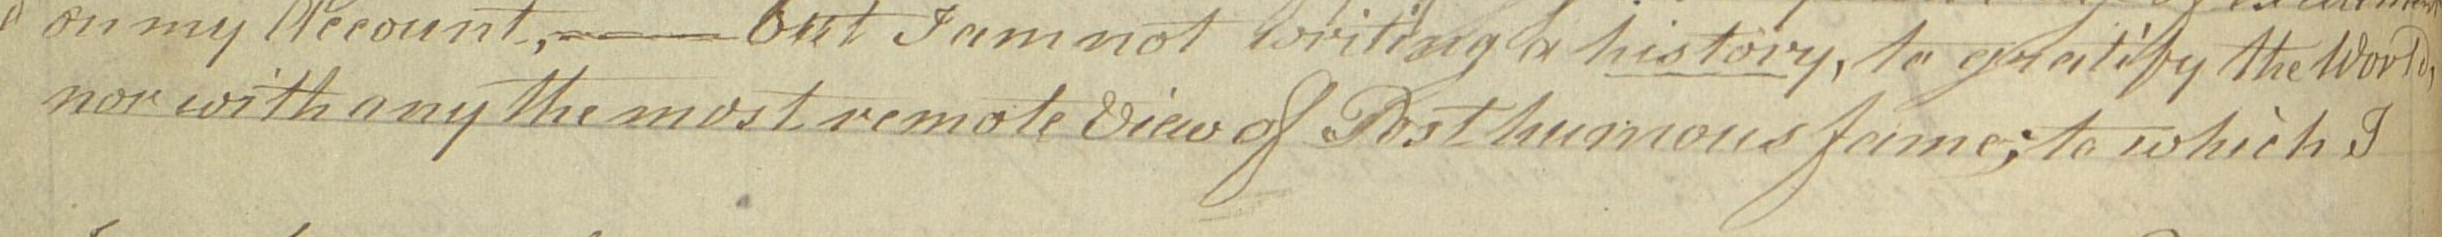nor with any the most remote view of Posthumous fame; to which I
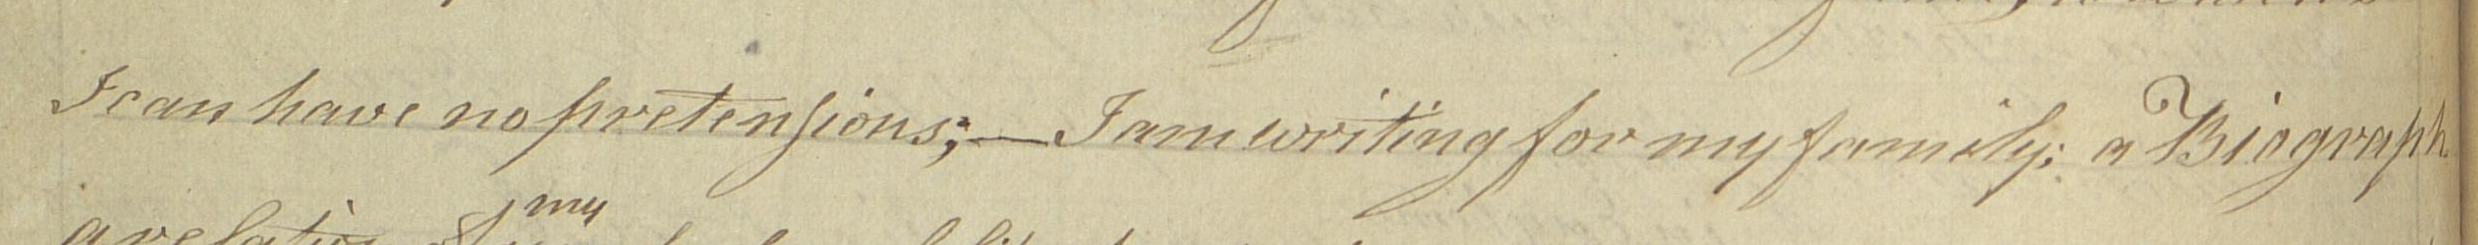I can have no pretensions; I am writing for my family; a Biograph
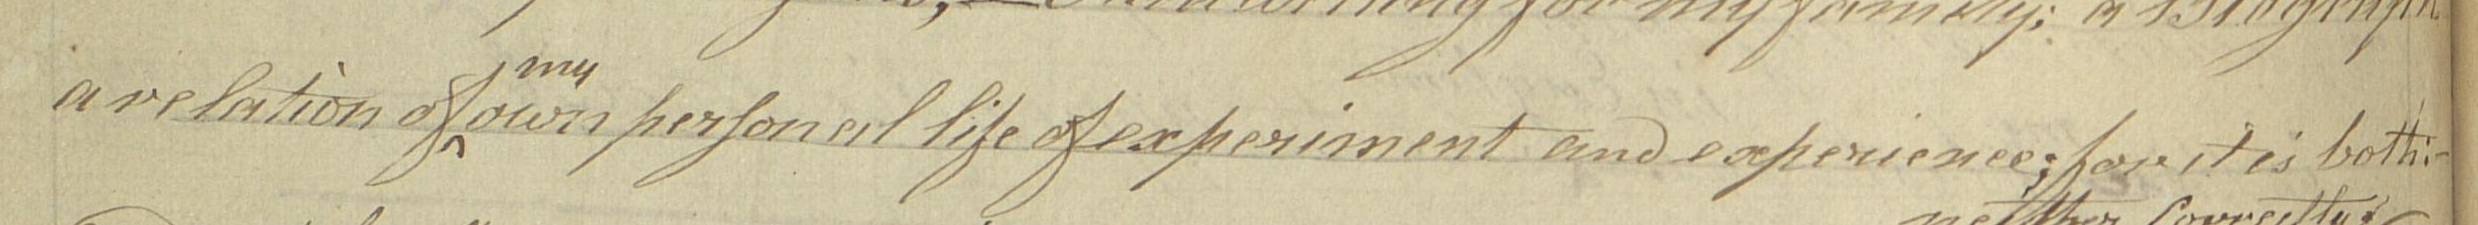a relation of ^ own personal life of experiment and experience; for it is both:
